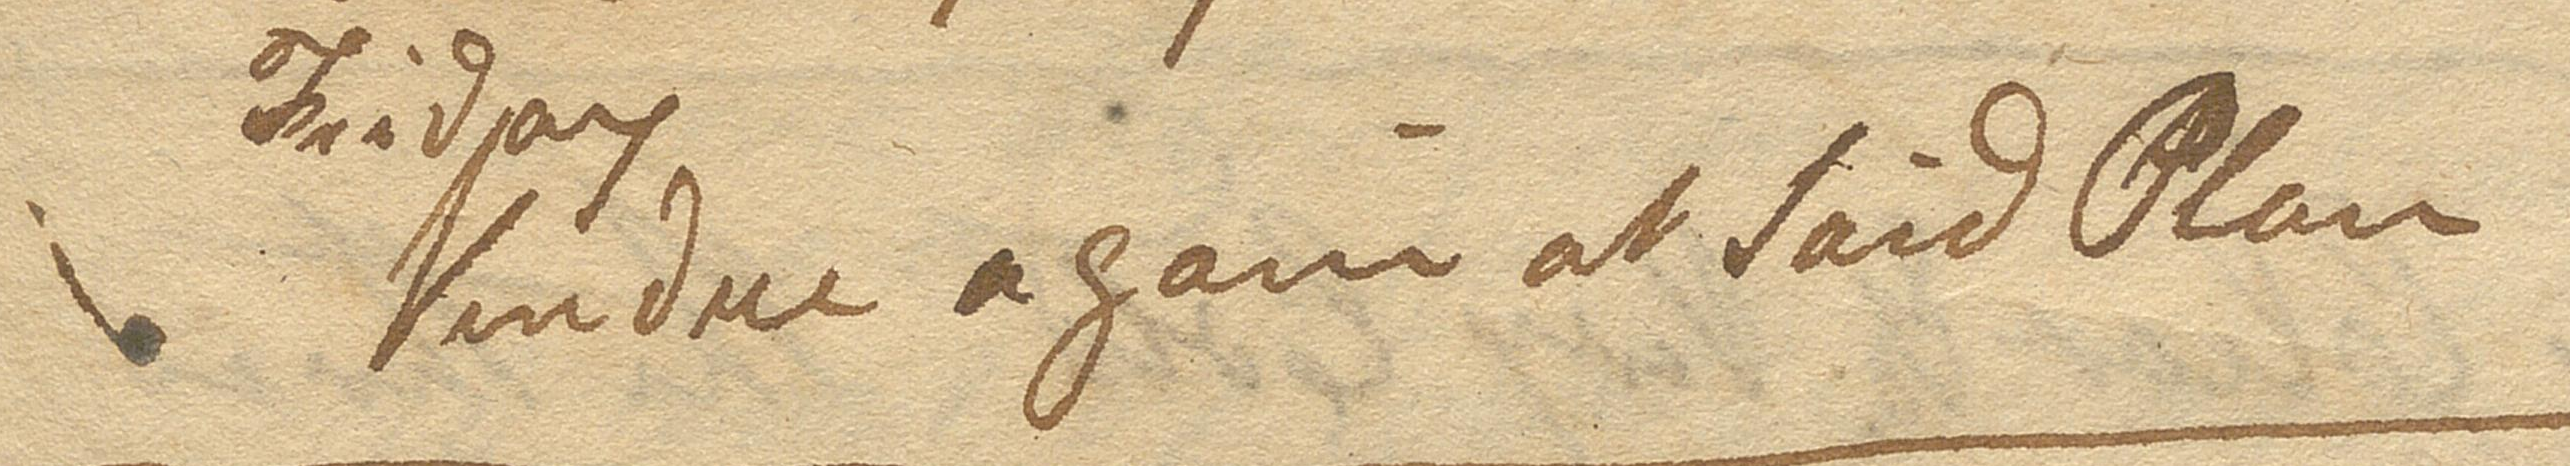Vendue again at said Plan
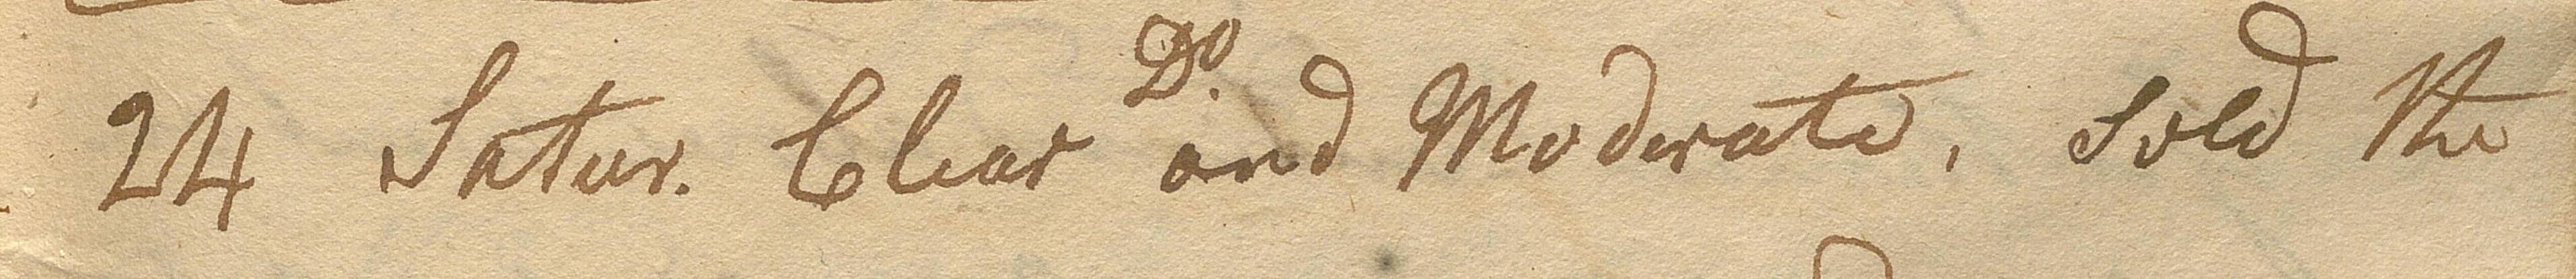24 Satur. Clear and Moderate, sold the
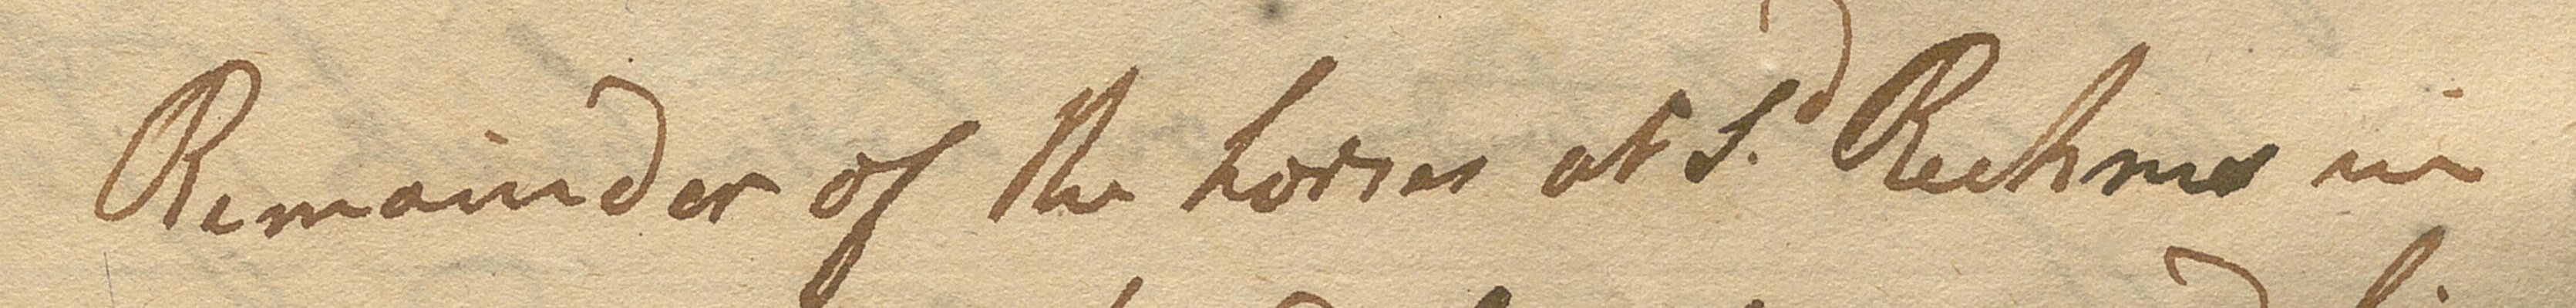Remainder of the horses at s^d. Rechms in
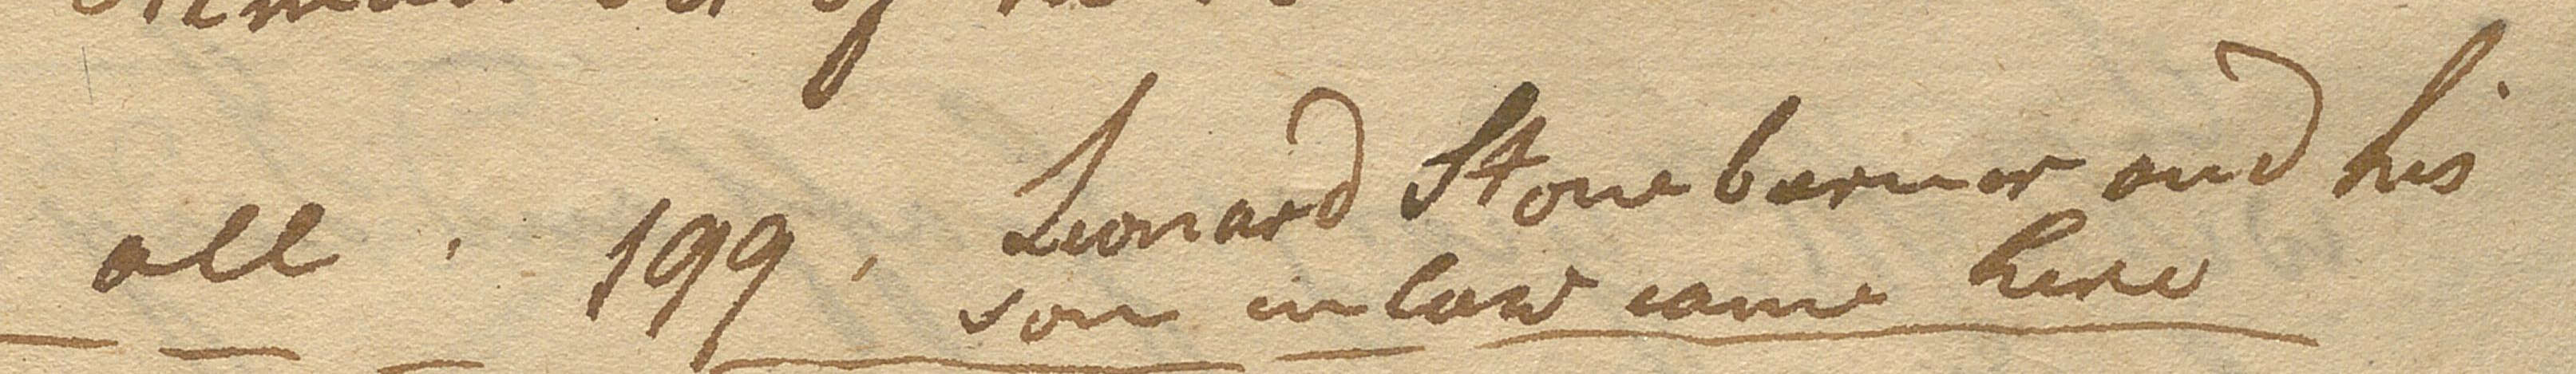all. 199. Leonard Stoneburner and his
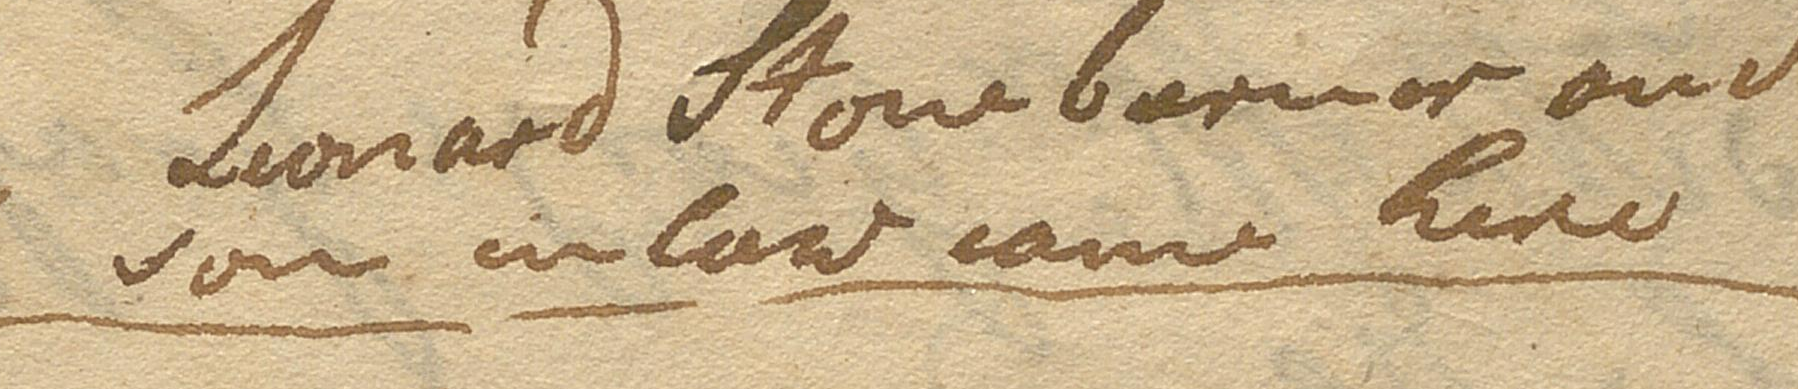son inlaw came here
